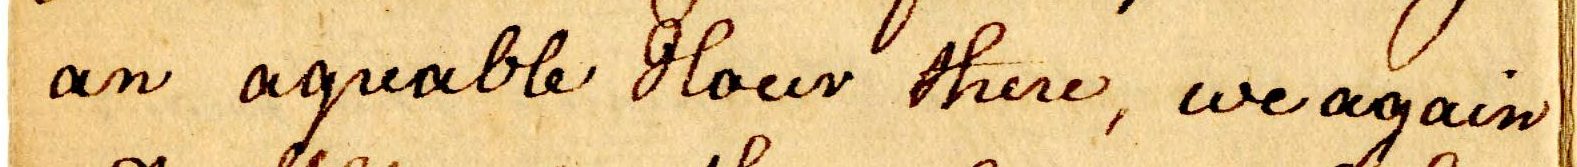an agreable Hour there, we again
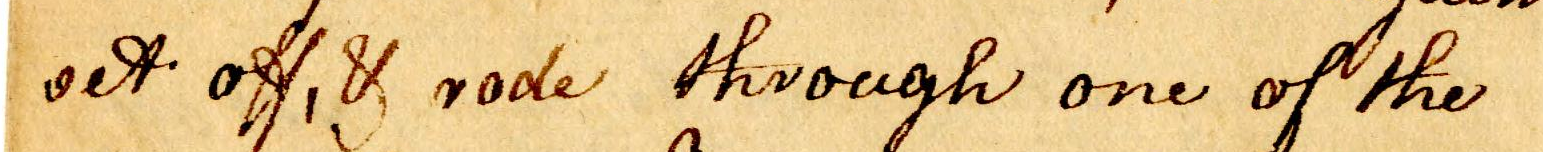set off, & rode through one of the
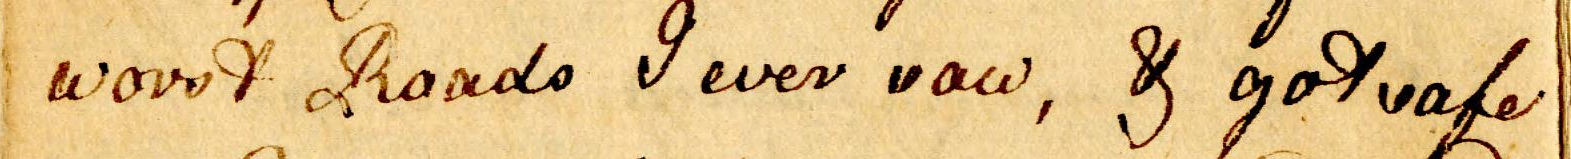worst Roads I ever saw, & got safe
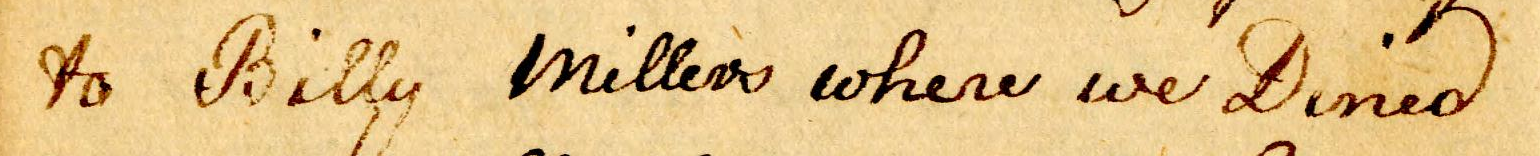to Billy Millers where we Dined
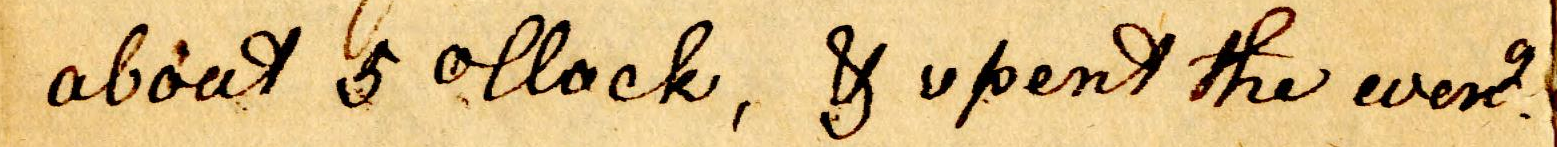about 5 ^oClock, & spent the ever^g
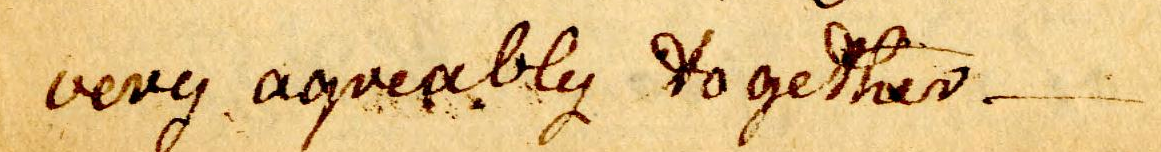very agreably together-
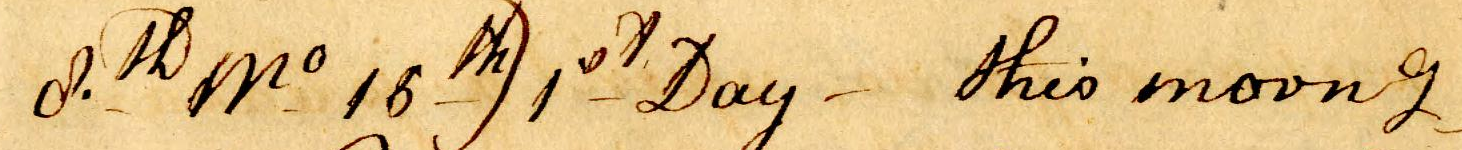8^th M^o 15^th) 1^st Day- this morn^g
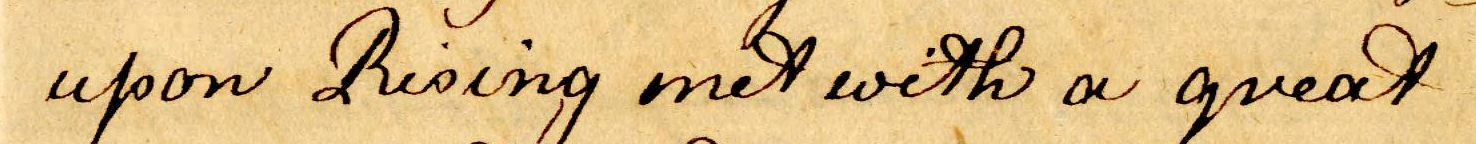upon Rising met with a great
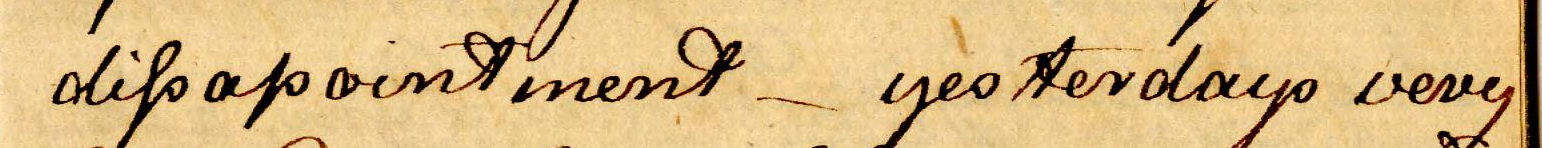dissapointment- yesterdays very
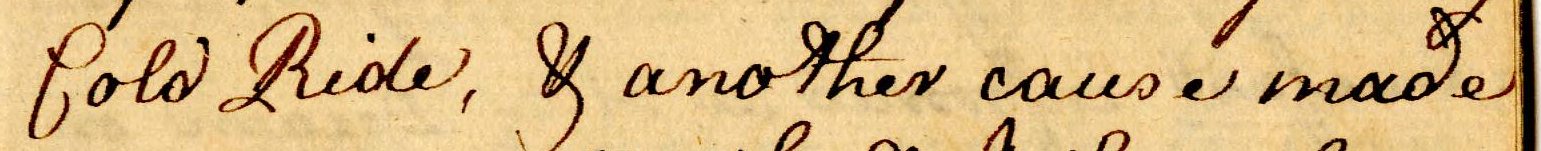Cold Ride, & another cause made
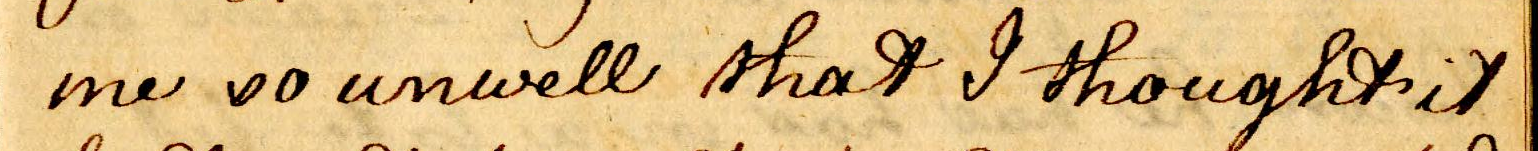me so unwell that I thought it
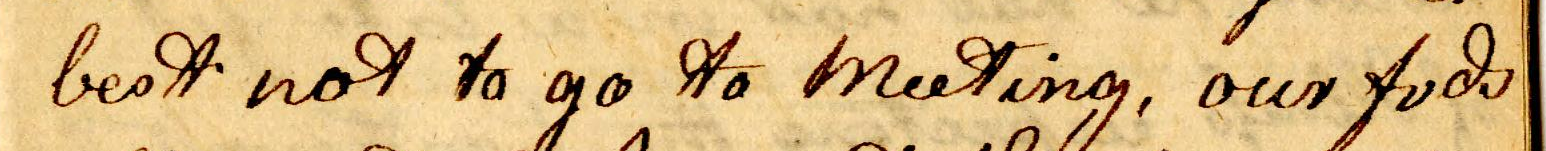best not to go to Meeting, our frds
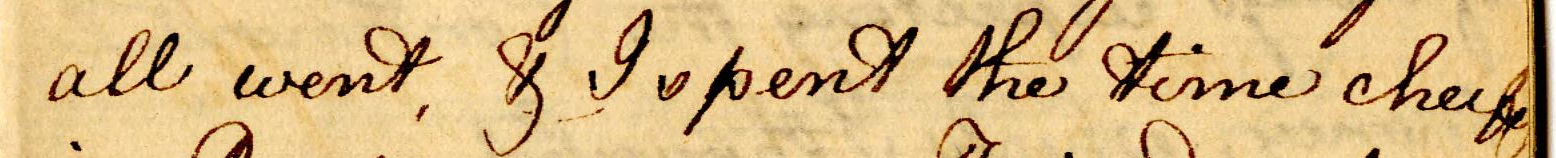all went, & I spent the time cheif
